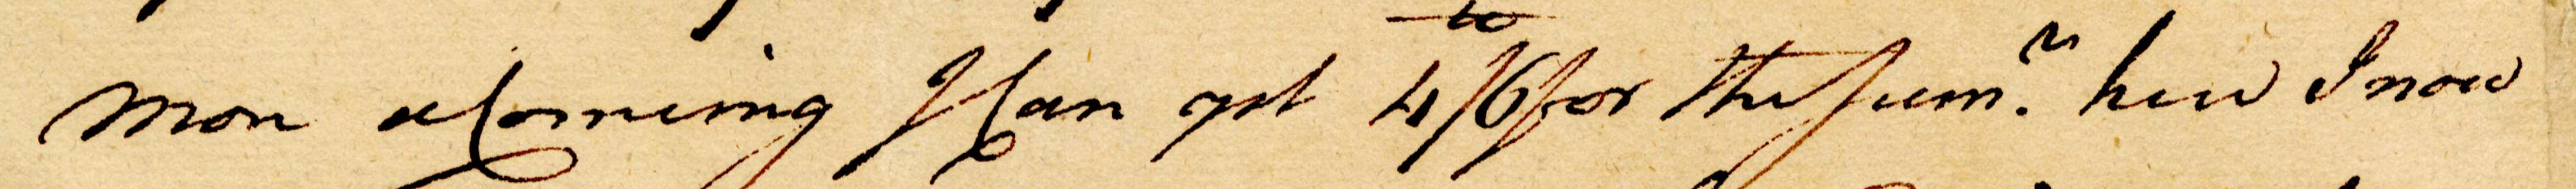more a Comimg I can get 4s6 for the sum^r. here I now
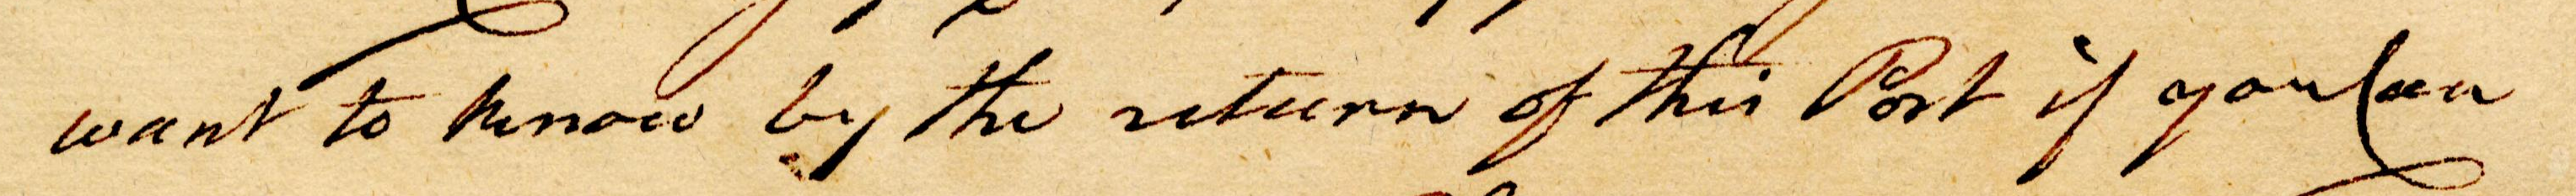want to know by the return of this Post if you can
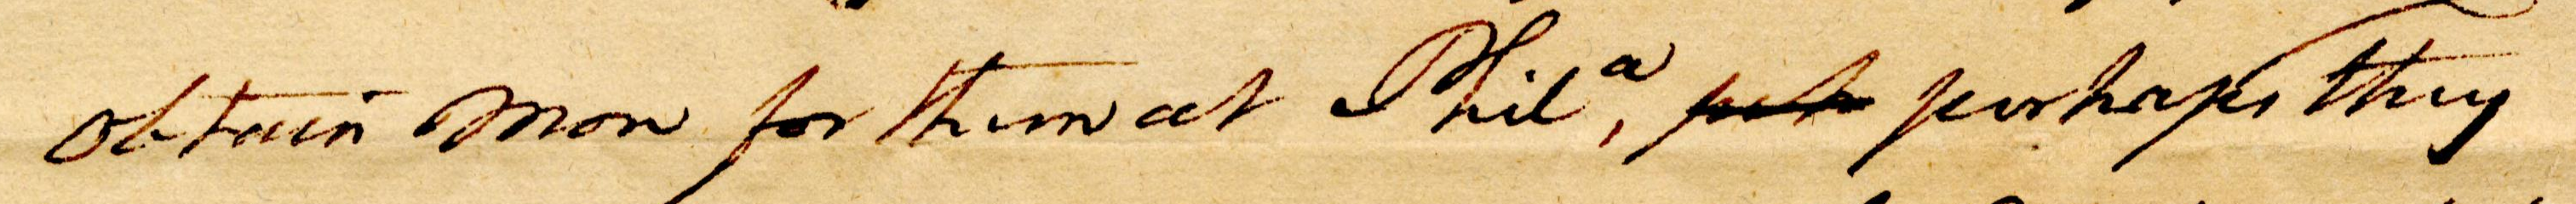obtain more for them at Phil^a [___] perhaps they
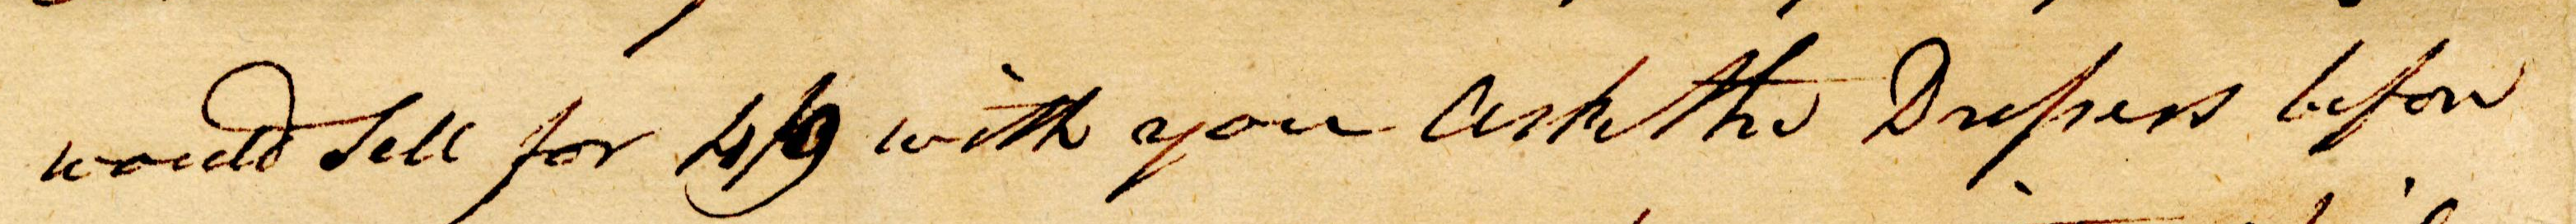would sell for 4s9 with you Ask the Dressers before
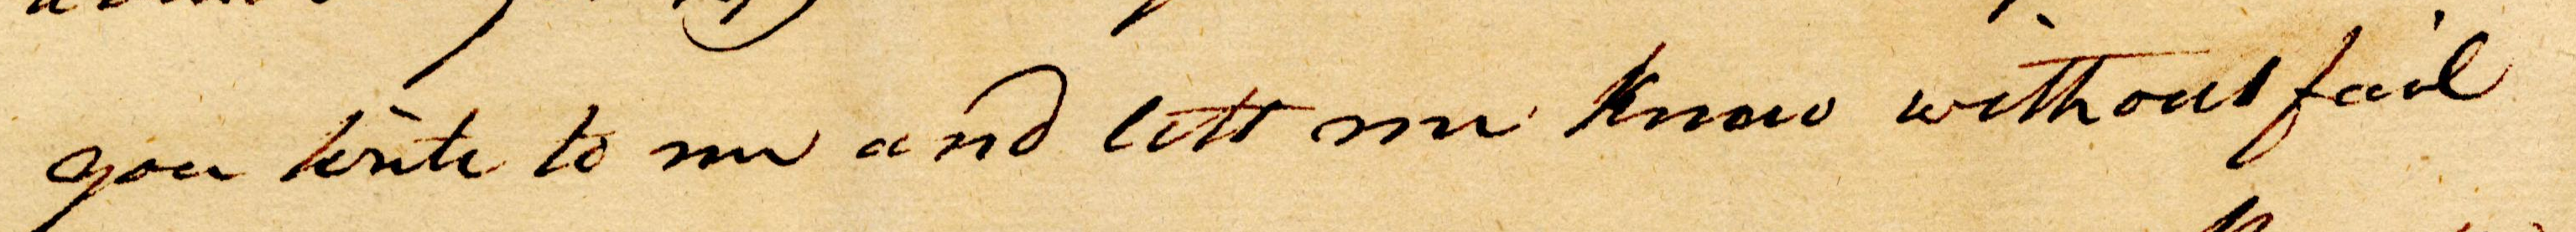you write to me and lett me know without fail
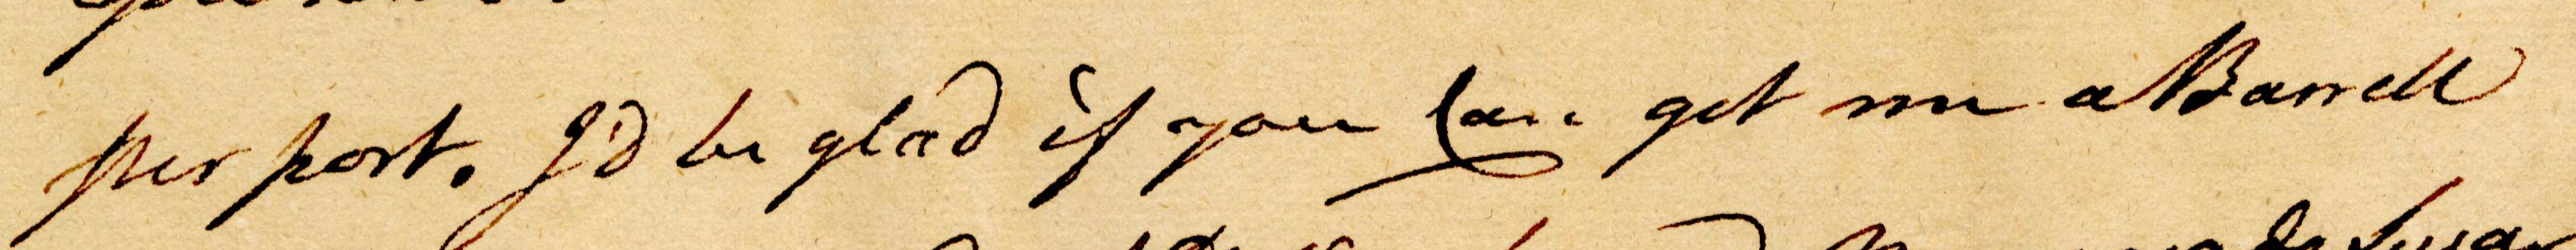per post. I'd be glad if you can get me a Barrell
